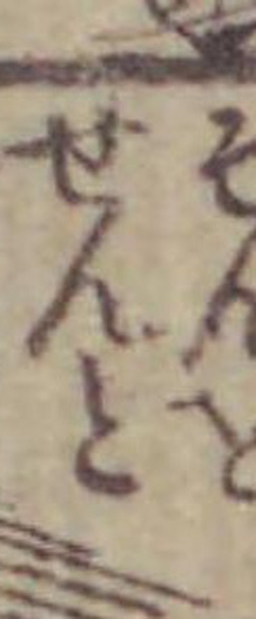せんと
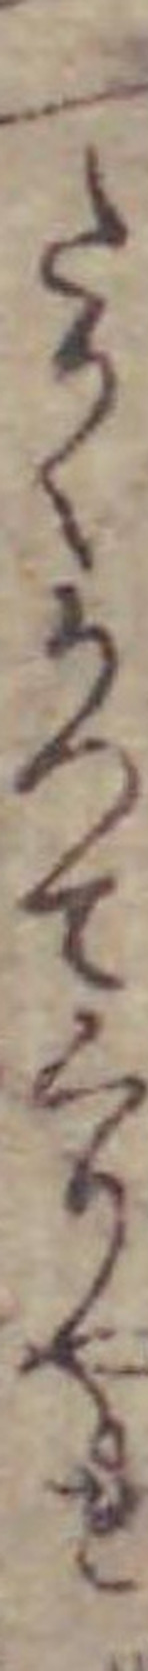たかくかつてくりやれ
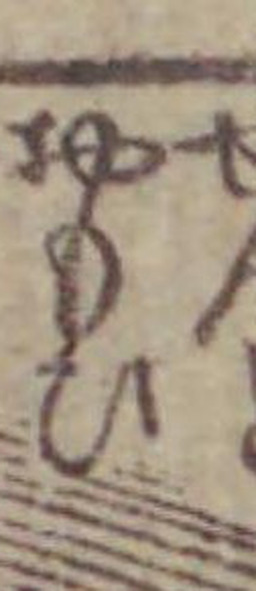おもひ
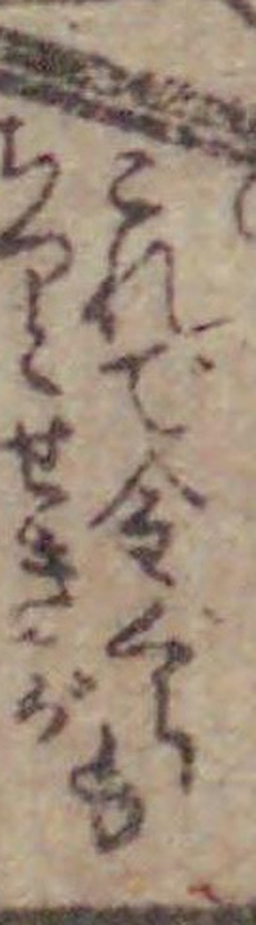ちつとせきが
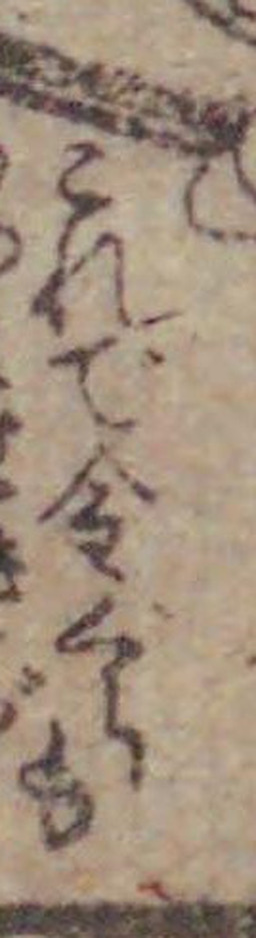これで金くらも
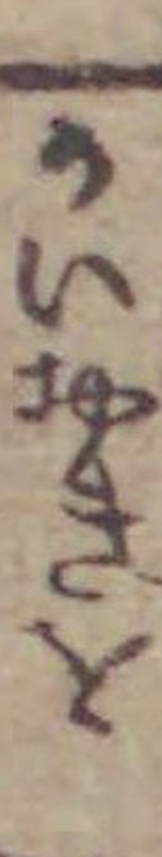かいおきを
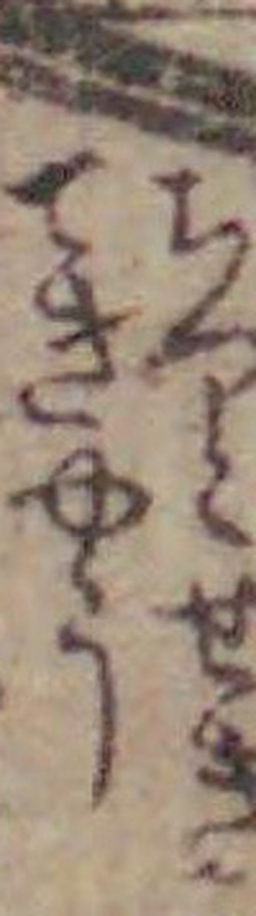てきやう
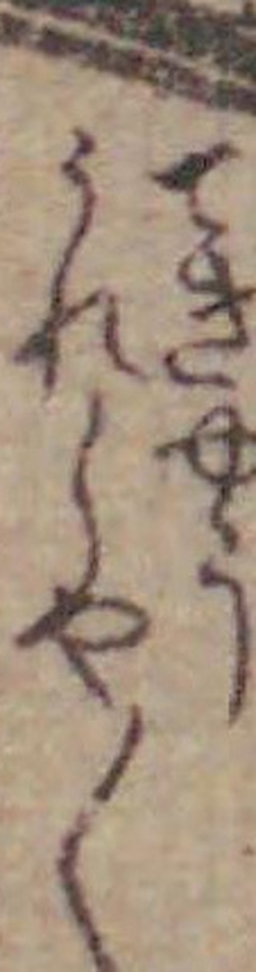うれしや〳〵

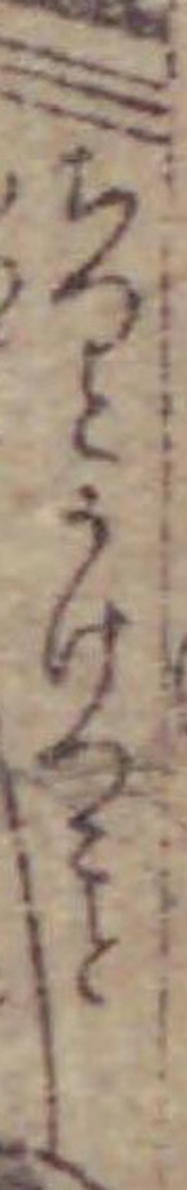ちつとかけつこと
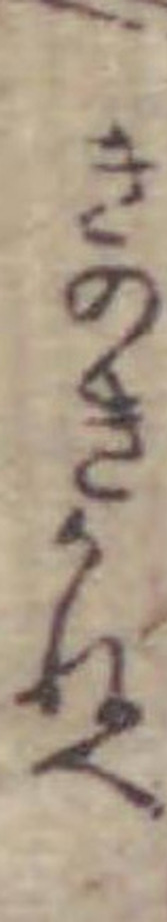きのきかねへ
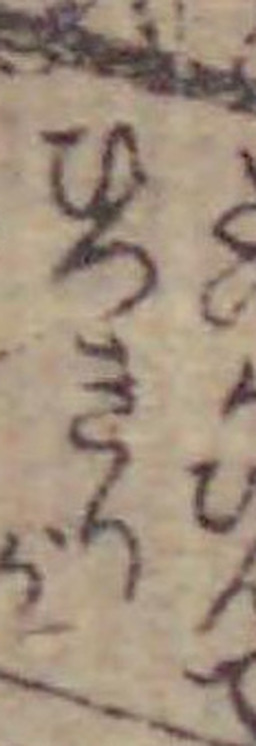ひつきりが
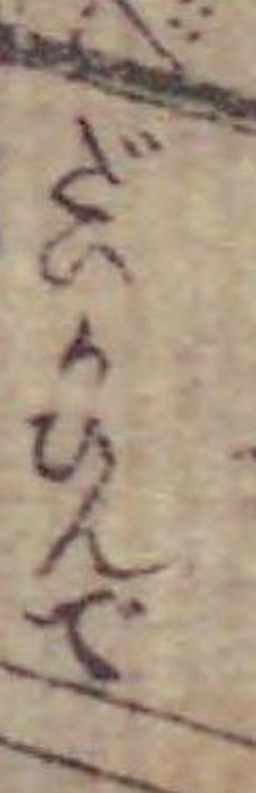だいかひんで
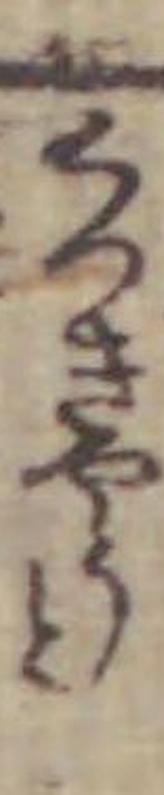くつきやうと
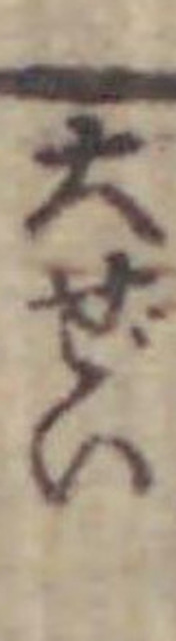大ぜい
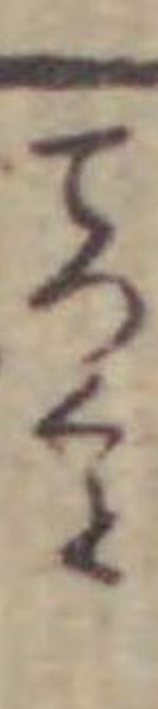てつくと
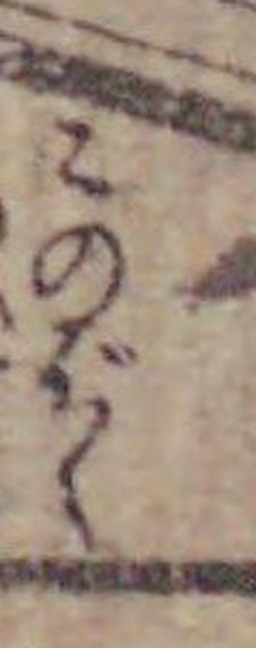このばく
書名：莫切自根金生木 : 3巻
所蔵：国立国会図書館 National Diet Library, JAPAN
